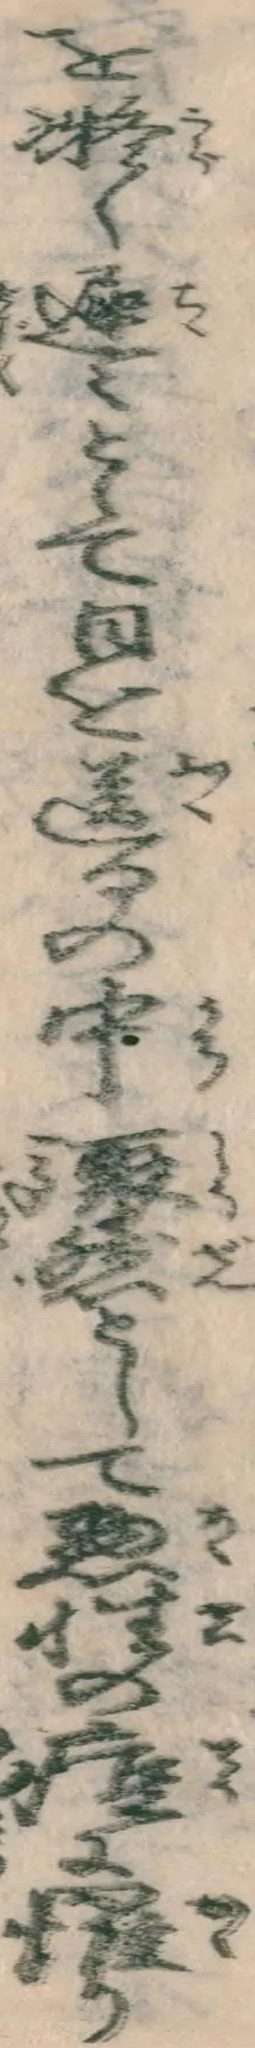を恭し遅々として日を送るの中然として悪性の痘に罹り
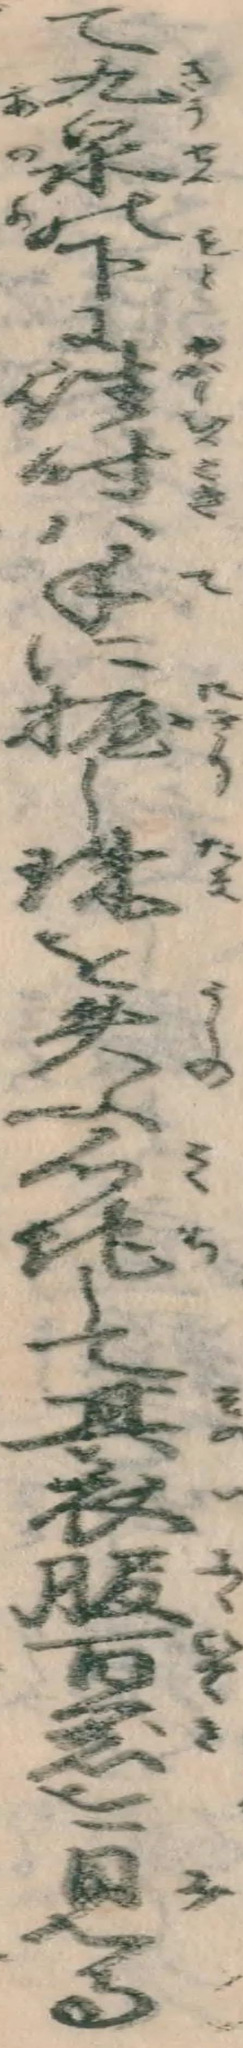て九泉の下に往時は手に握し珠を失ふ心地して其衣服百器を見る
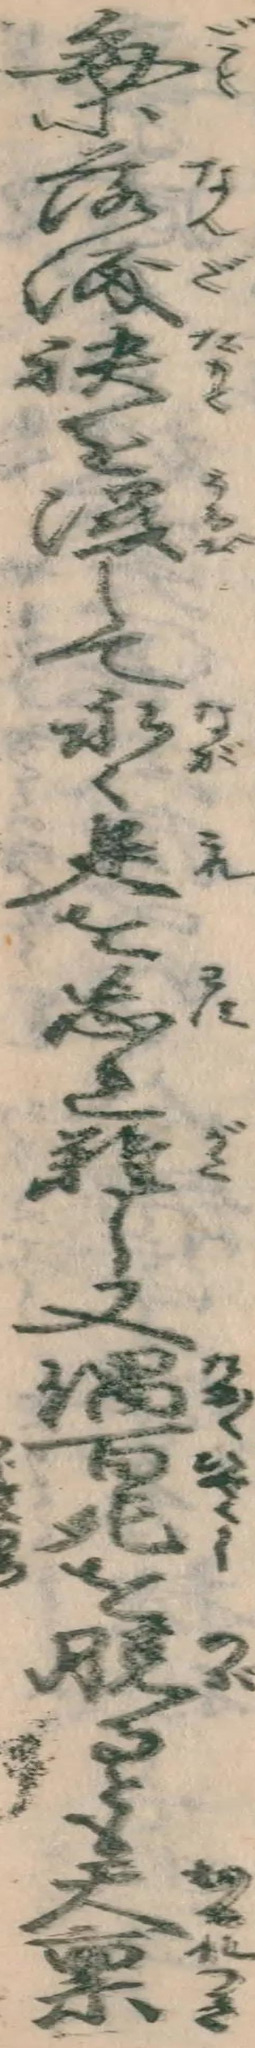毎に何度袂を湿して永く是を忘れ難し又偶百死を脱るとも天稟
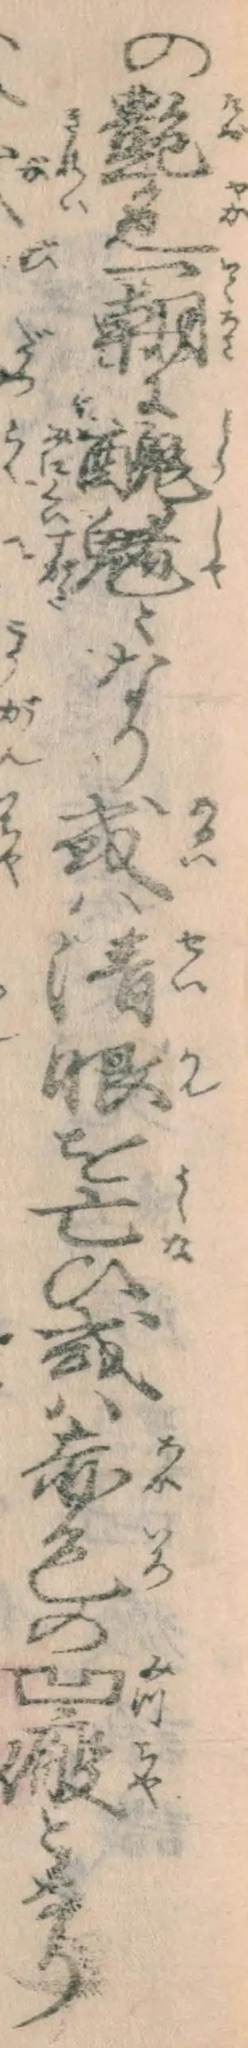の艶色一朝に醜となり或は清恨を亡ひ或は赤色の凹瘢となり
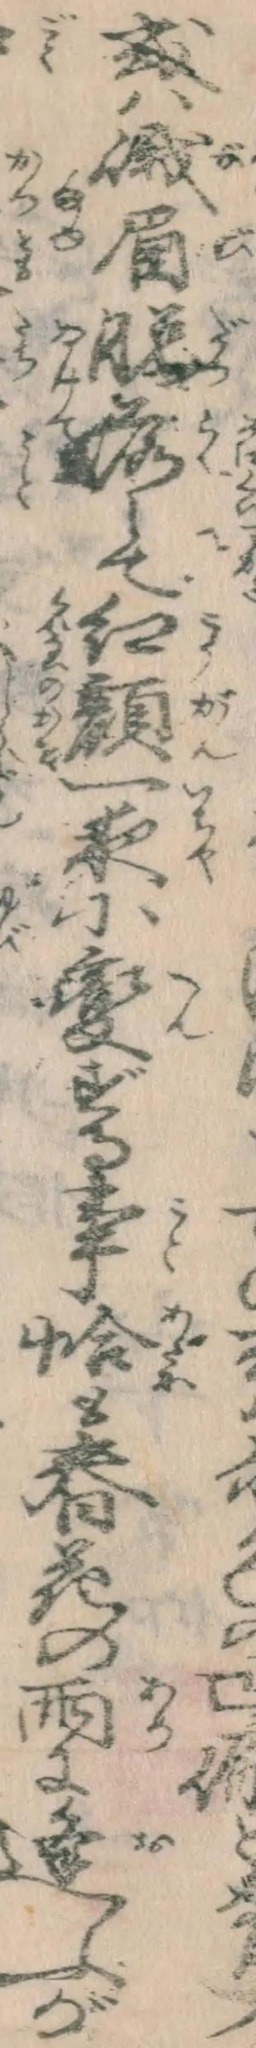或は我眉脱落して紅顔一夜に変ずる事恰も春花の雨に逢ふが
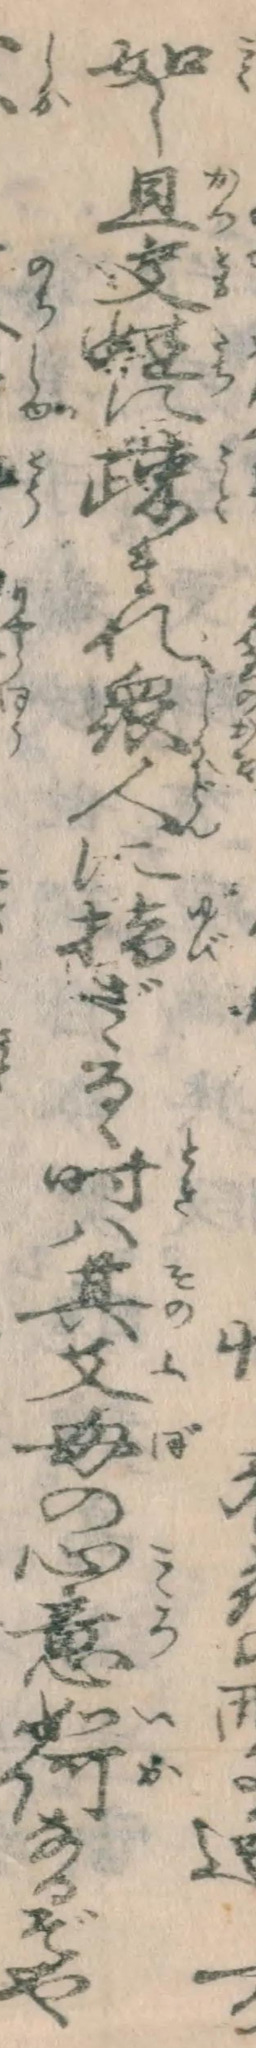如し且友性に疎まれ衆人に指ざゝるゝ時は其父母の心意如何なるぞや
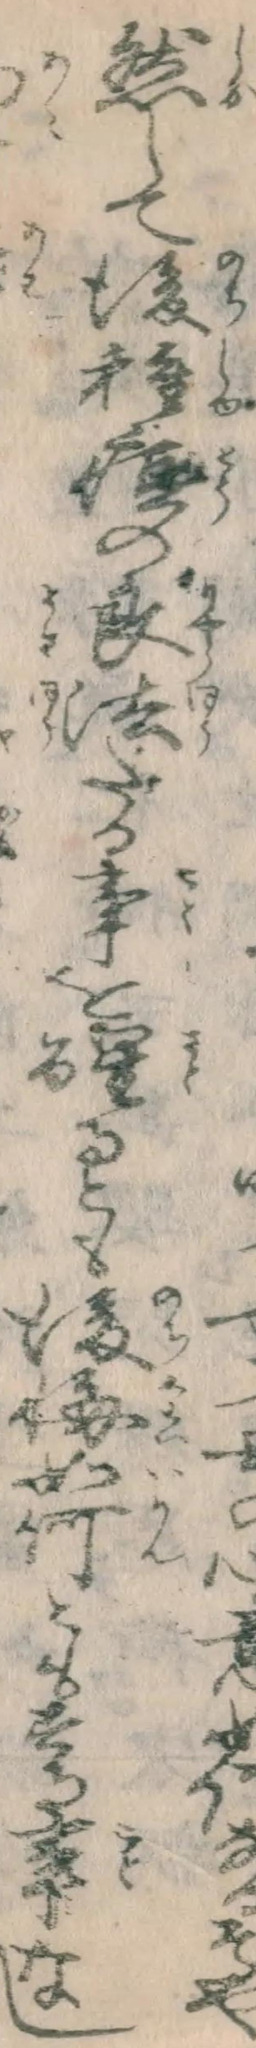然して後種痘の良法たる是を確るとも後悔如何ともする事なし
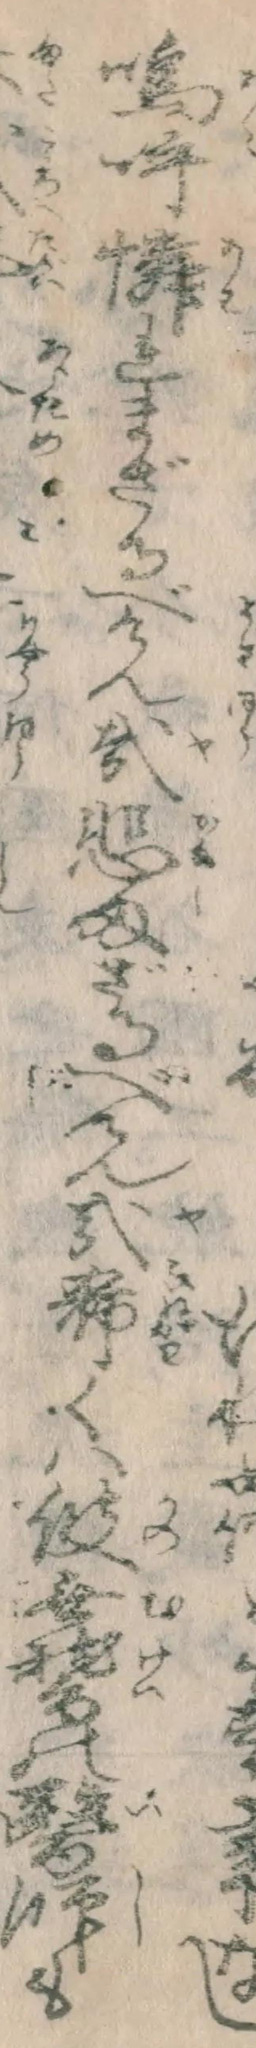嗚呼憐れまざるべけん哉悲まざるべけん哉希くは彼無稽の医師も
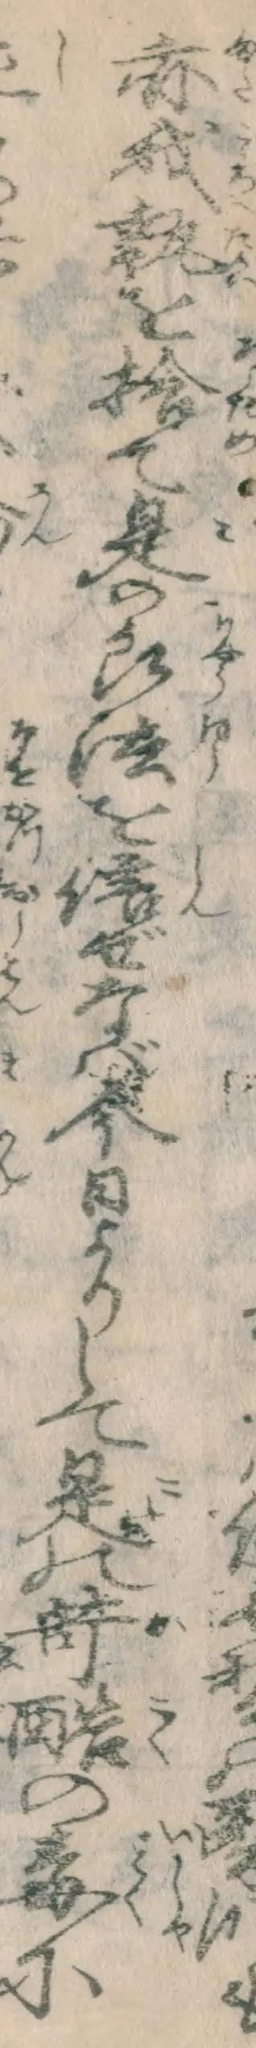亦我執を捨て是の良法を信ぜなば今日よりして是の苛酷の毒に
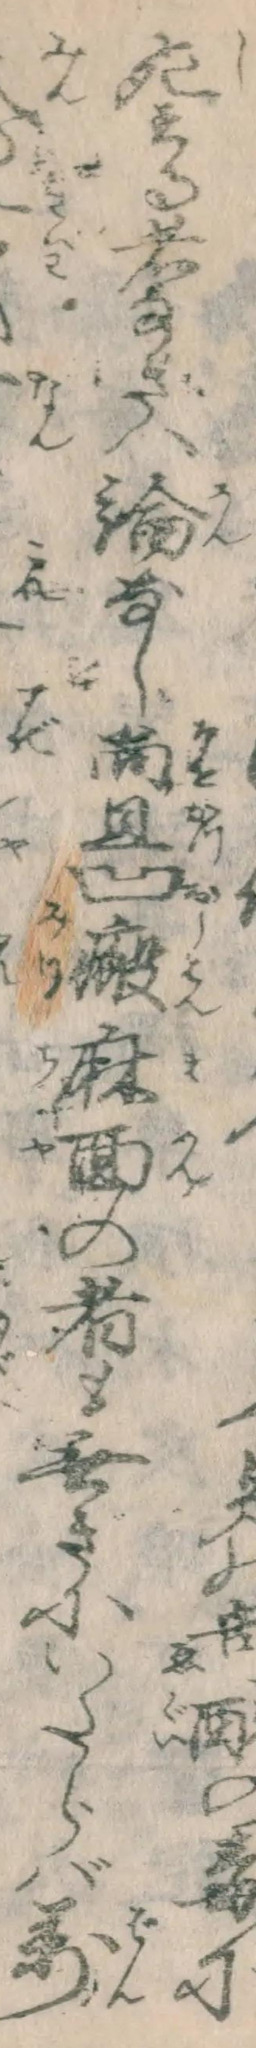死する者なきは論なし尚且凹瘢麻面の者も無きにいたらば万
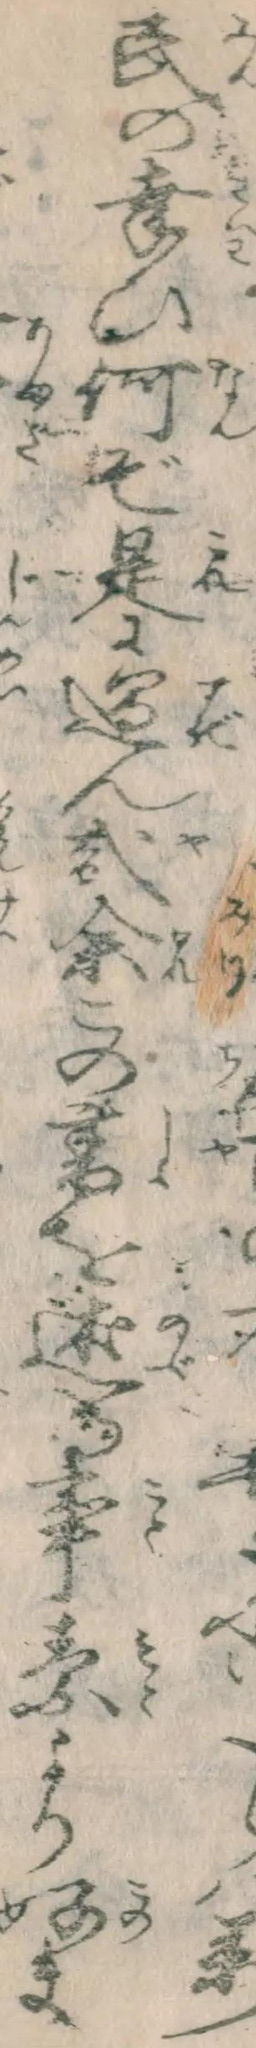民の幸ひ何ぞ是に過ん哉余この書を述る事素より好ま
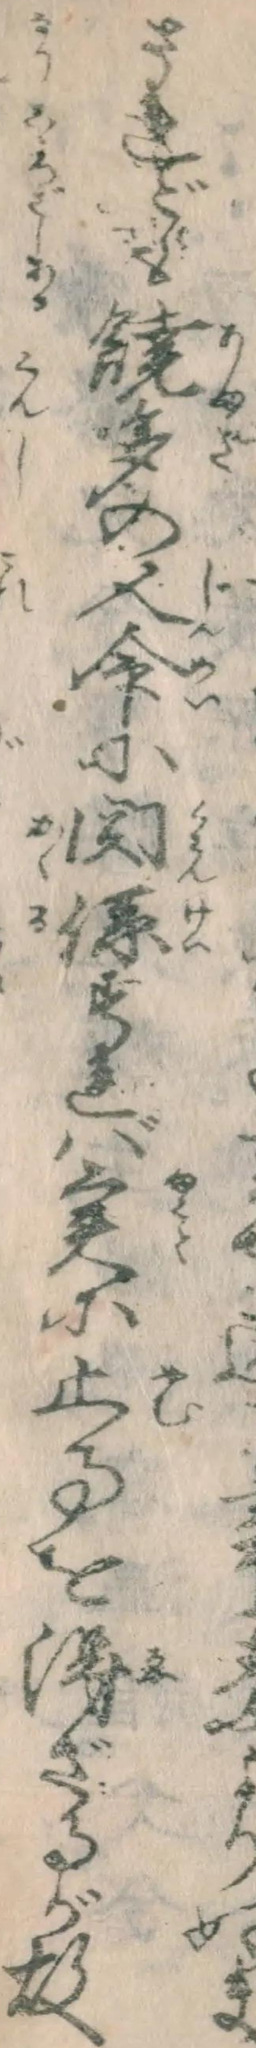されども余多の人命に関係すれば実に止事を得ざるが故
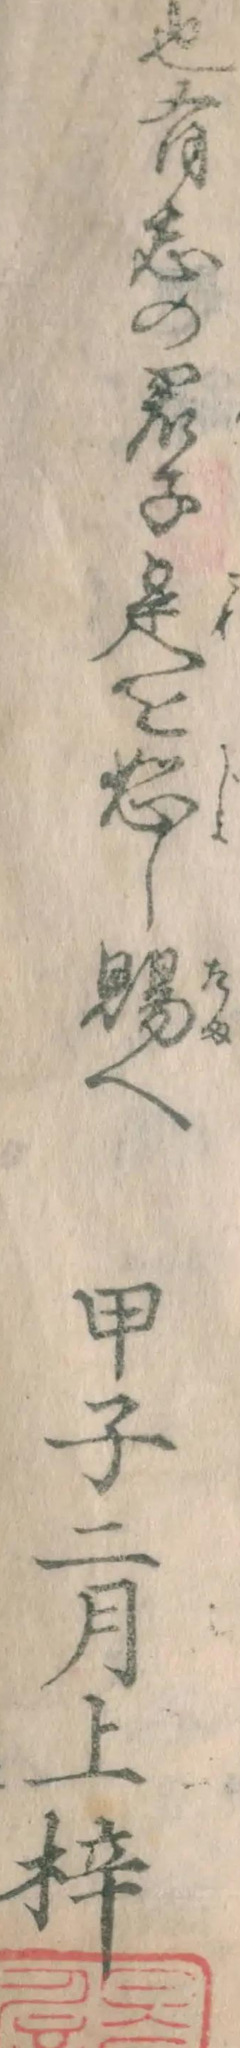也有志の君子是を怒し賜へ甲子二月上梓
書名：種痘辨
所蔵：国立国会図書館 National Diet Library, JAPAN
